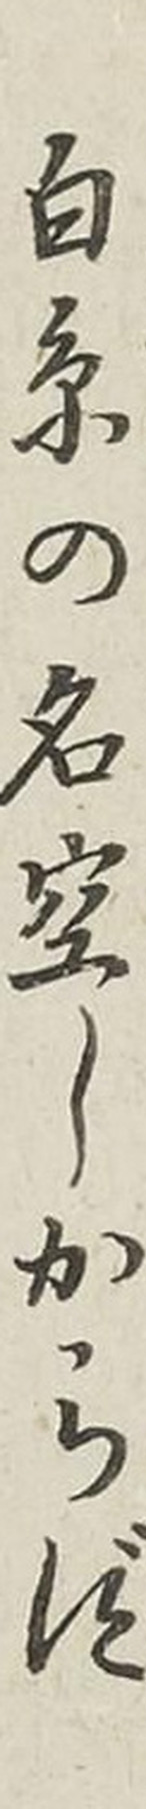白糸の名空しからず
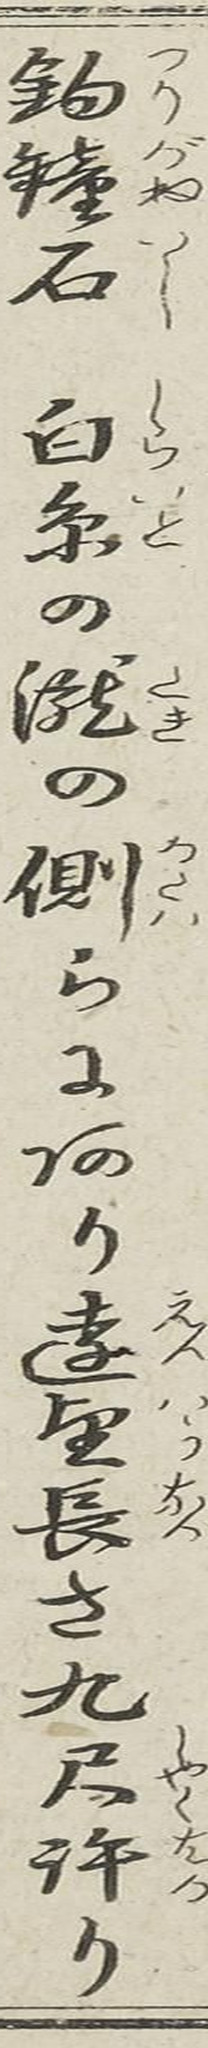釣鐘石白糸の瀧の側らにあり遠望長さ九尺許り
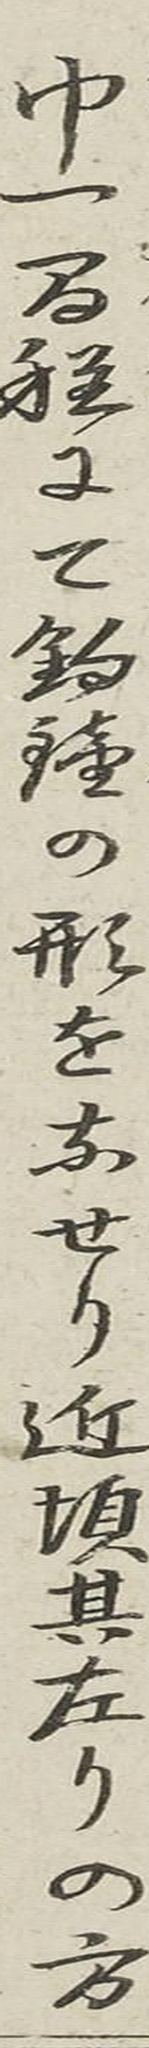巾一間程にて釣鐘の形をなせり近頃其左りの方
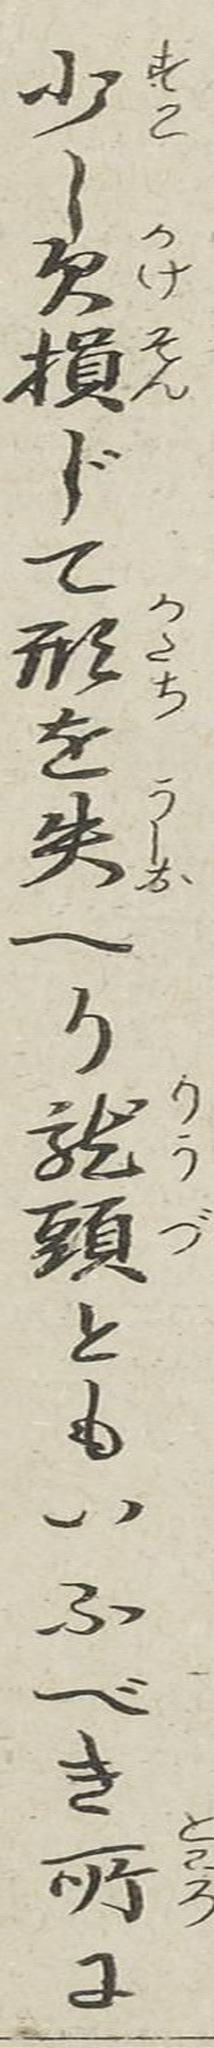少し欠損じて形を失へり龍頭ともいふべき所に

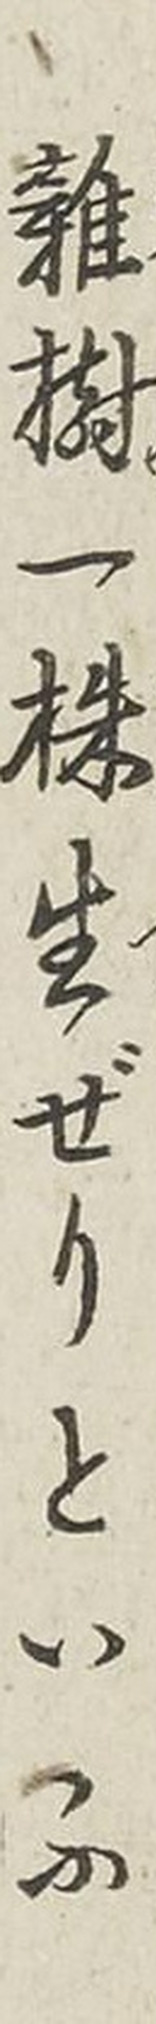雑樹一株生ぜりといふ
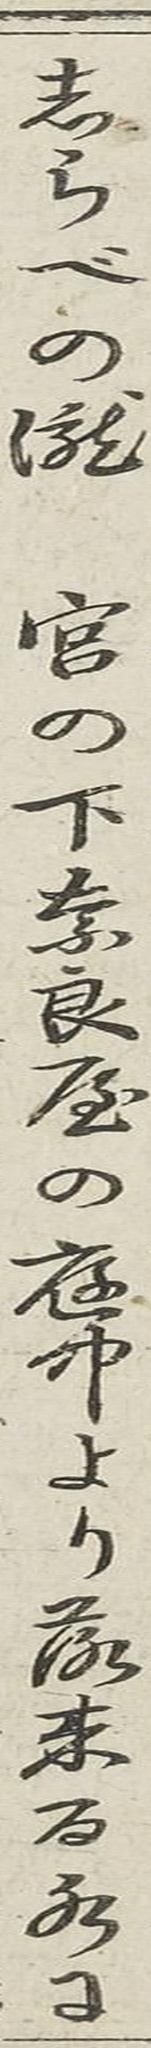しらべの瀧宮の下奈良屋の底中より落来る水に
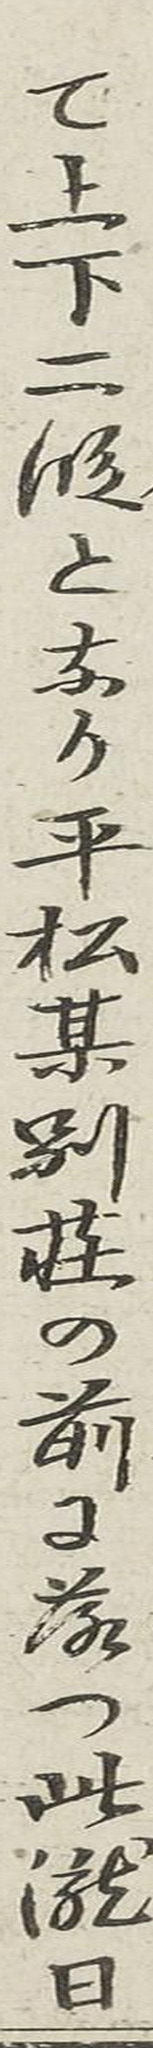て上下二段となり平松某別荘の前に落つ此瀧日
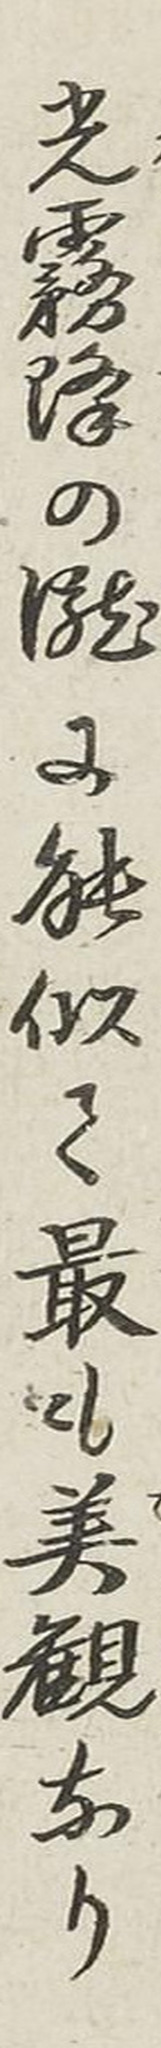光霧降の瀧に能似て最も美観なり
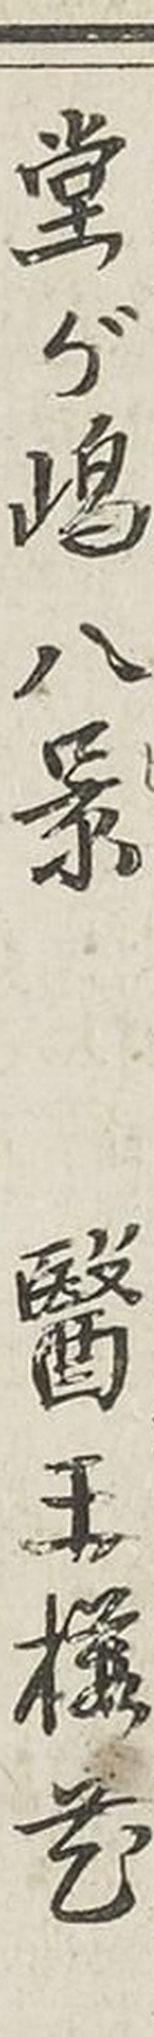堂が島八景醫王桜花
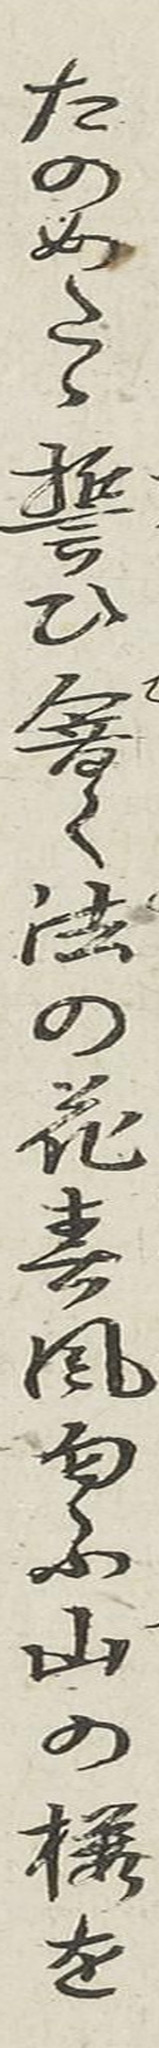たのめたゝ誓ひ響く法の花春風匂ふ山の桜を
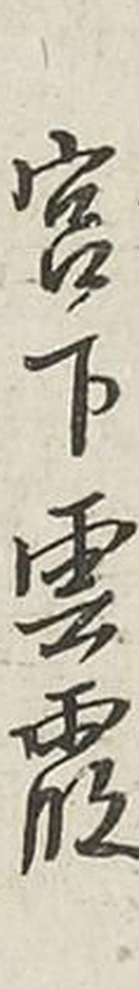宮下雲霞
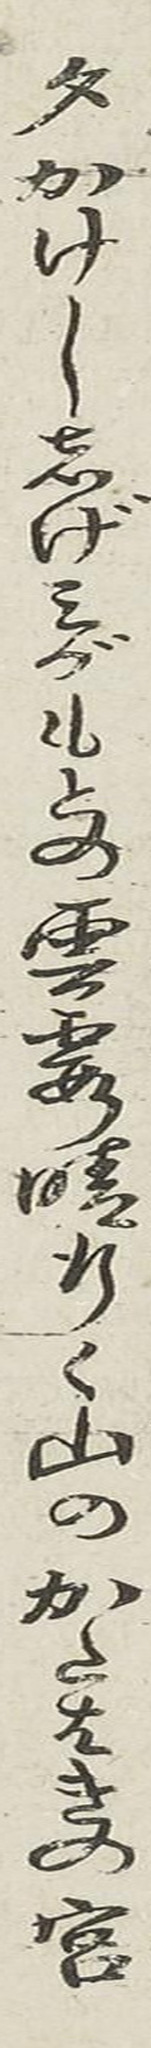夕かけししげみづもとの雲霞晴行く山のかたはきの宮
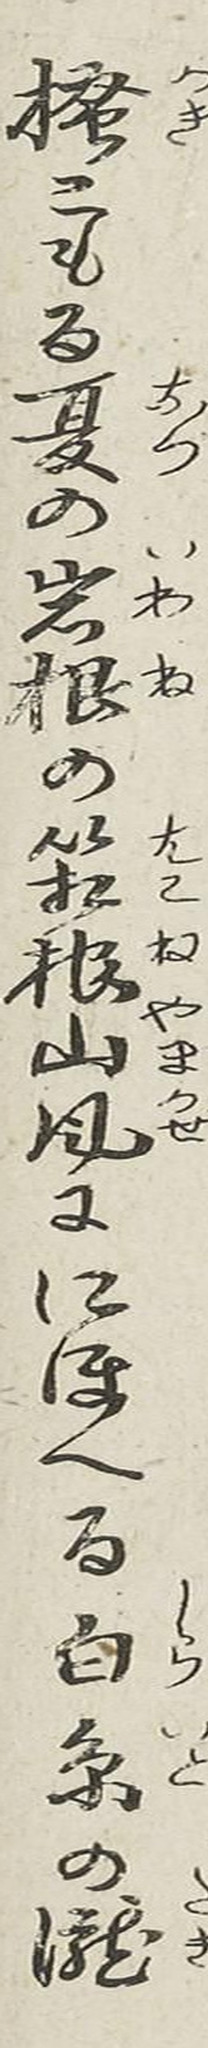掻きこもる夏の岩根の箱根山風ににほへる白糸の瀧
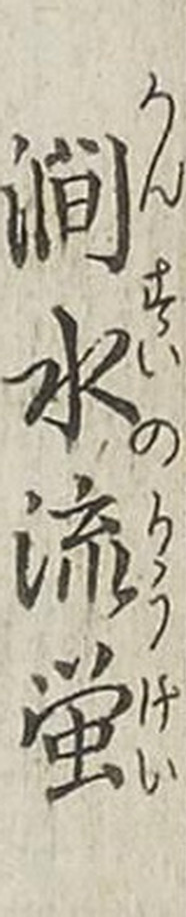澗水流蛍
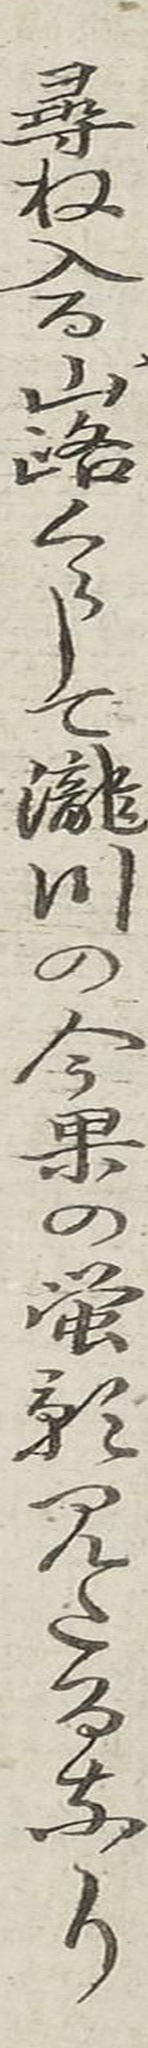尋ね入る山路くろして瀧川の今果の蛍影見たるなり
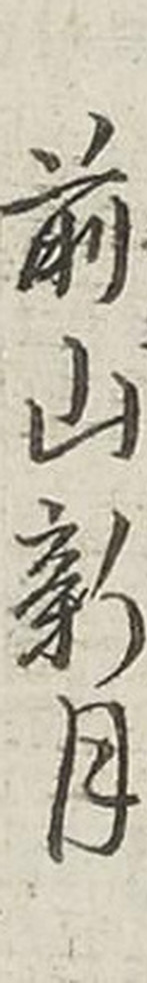前山新月
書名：箱根温泉誌　全
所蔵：東京大学地震研究所図書室 Earthquake Research Institute Library, The University of Tokyo, JAPAN
